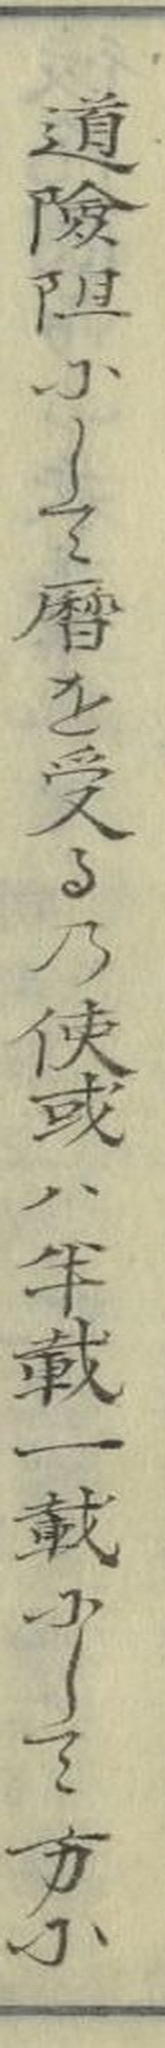道険阻にして暦を受るの使或は半載一載にして方に
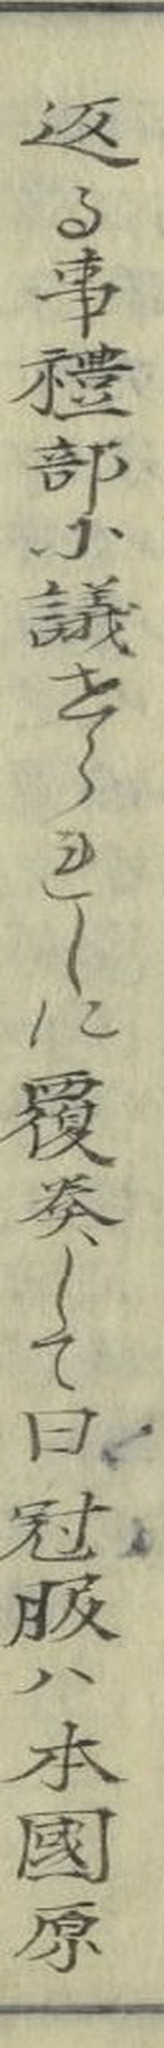返る事礼部に議せられしに覆奏して曰冠服は本国原
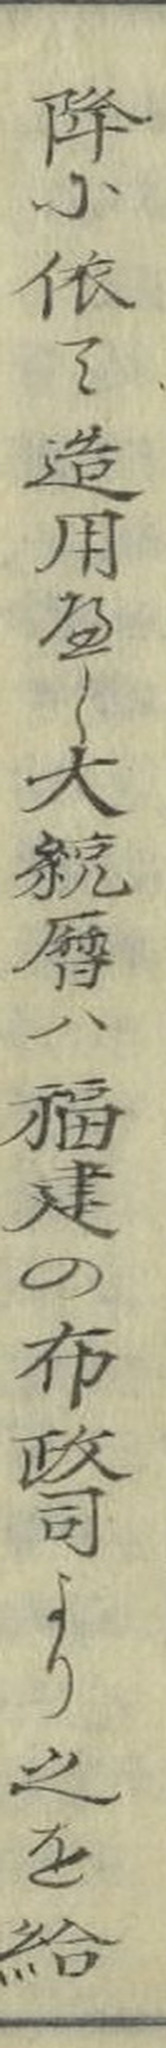降に依て造用へし大統暦は福建の布政司より之を給
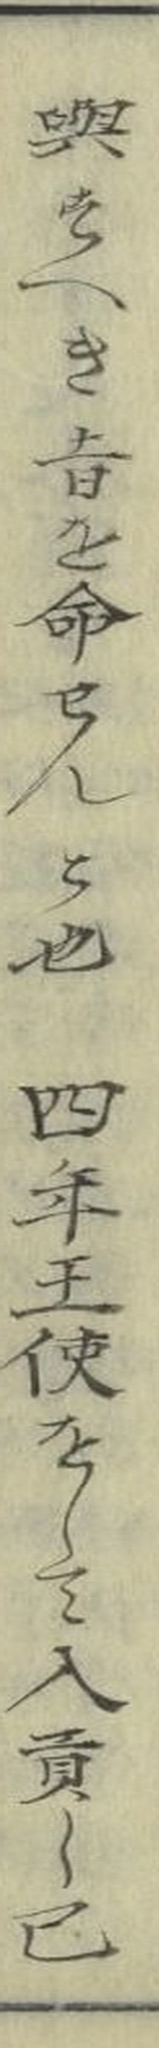与すへき旨を命せんと也四年王使をして入貢し已

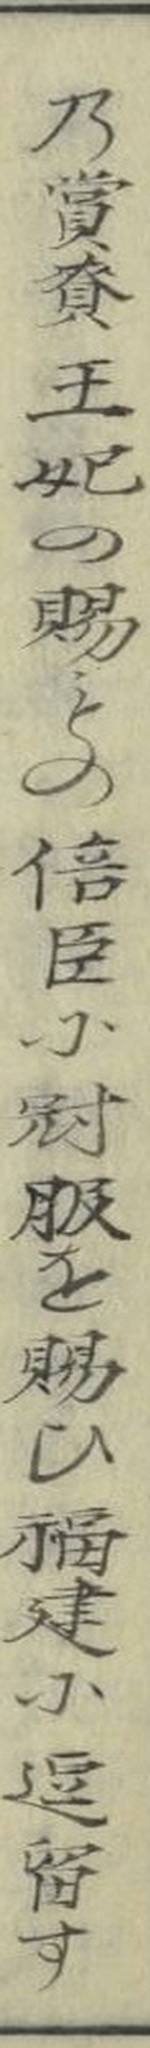の賞賚王妃の賜もの倍臣に冠服を賜ひ福建に逗留す
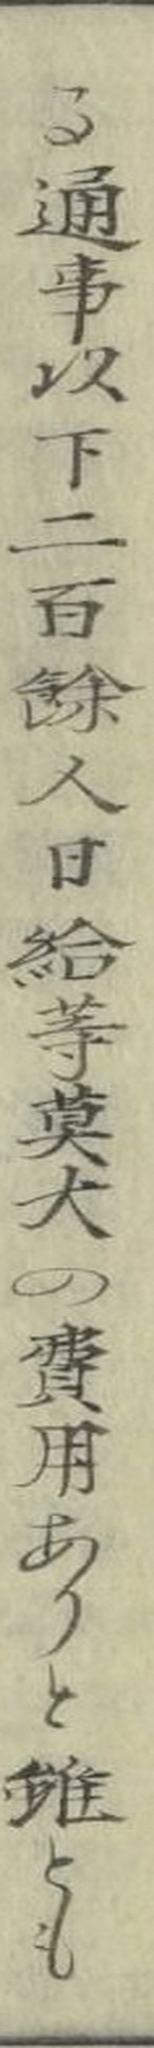る通事以下二百餘人日給等莫大の費用ありと雖とも
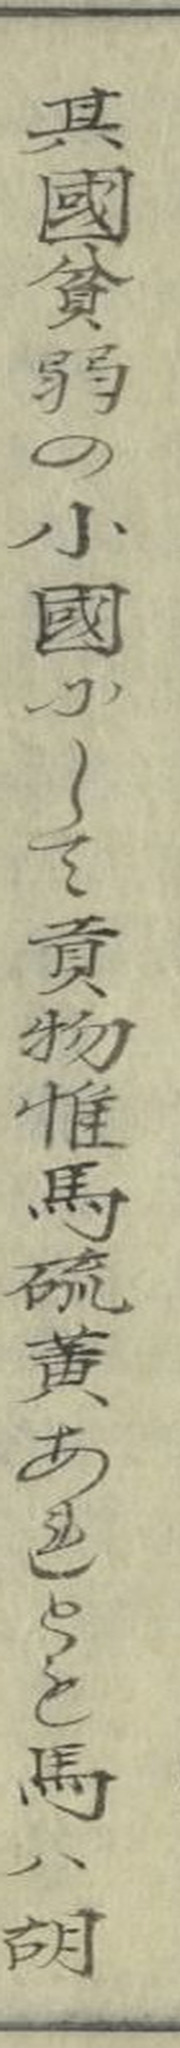其国貧弱の小国にして貢物惟馬硫黄あれとも馬は胡
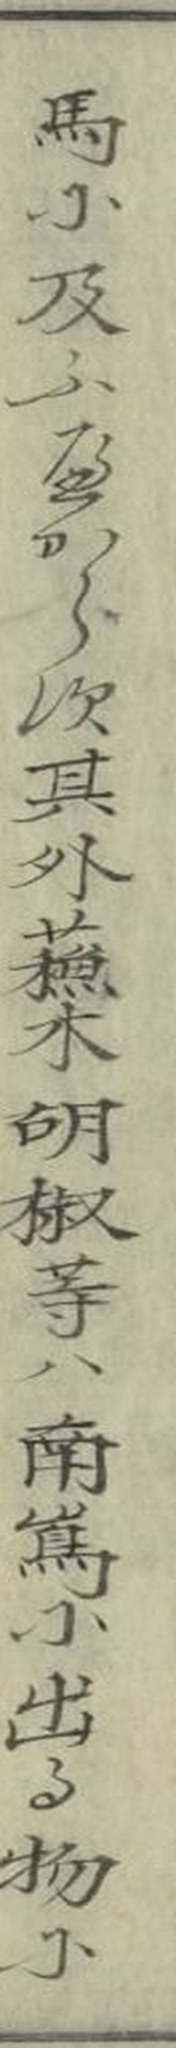馬に及ふへからす其外蘇木胡椒等は南嶌に出る物に
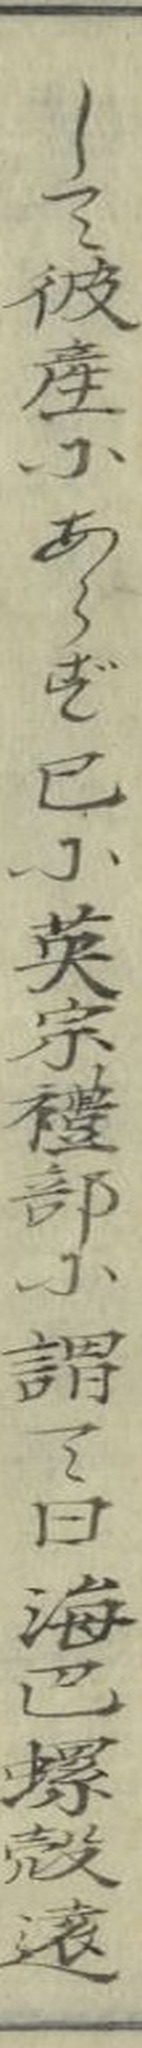して彼産にあらず已に英宗礼部に謂て曰海巴螺殻遠
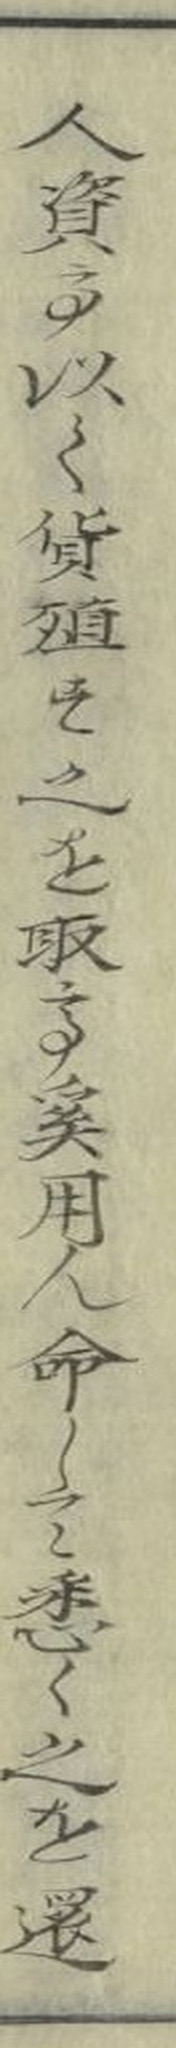人資て以て貨殖す之を取て奚用ん命して悉く之を還
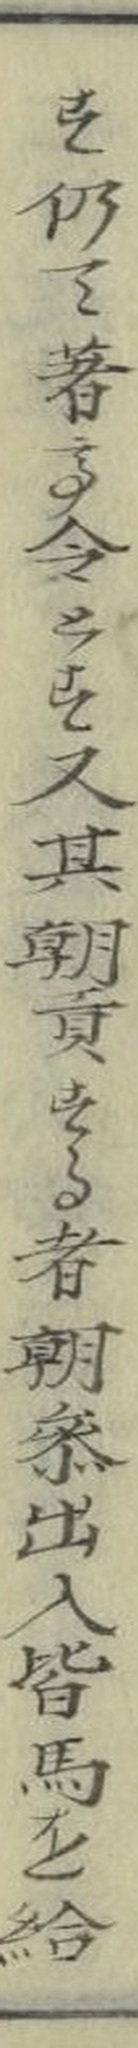す仍て著て令とす又其朝貢する者朝参出入皆馬を給
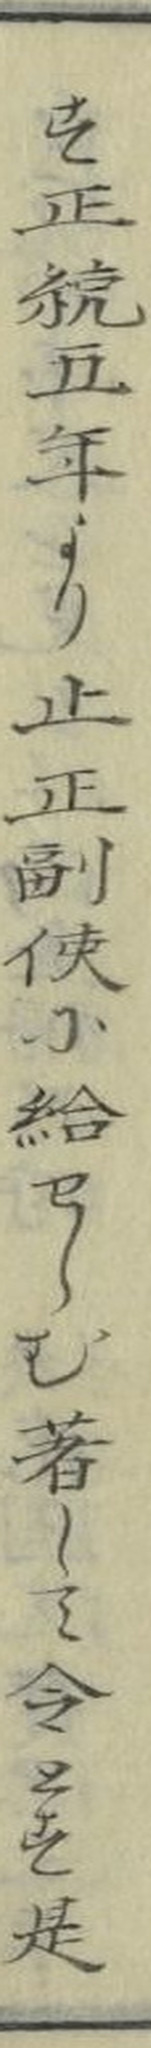す正統五年より止正副使に給せしむ著して令とす是
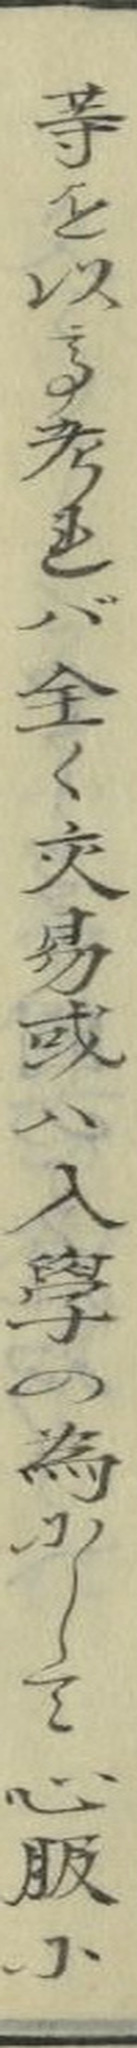等を以て考れば全く交易或は入学の為にして心服に
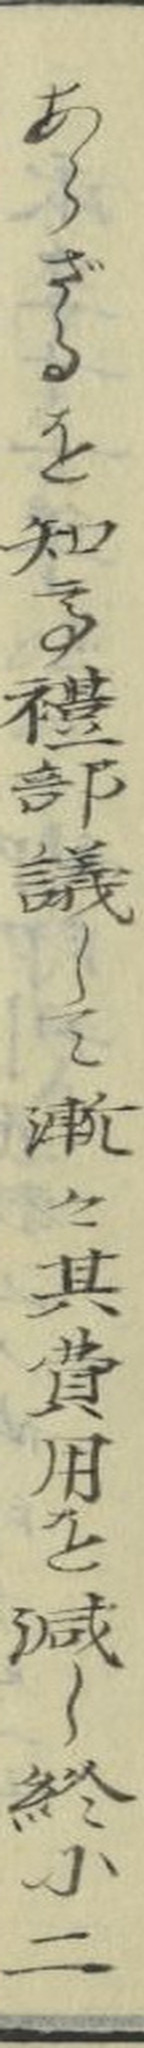あらざるを知て礼部議して漸々其費用を減し終に二
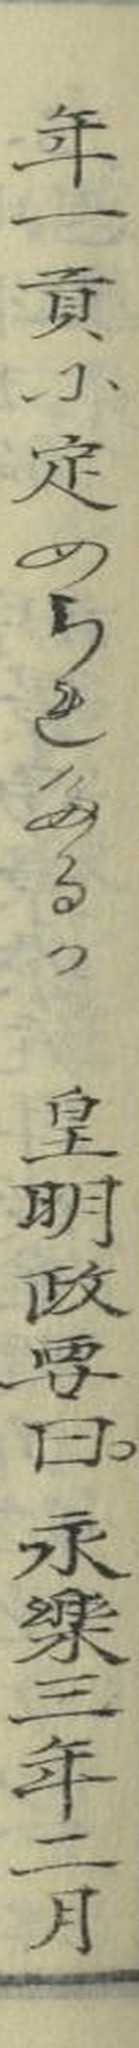年一貢に定められたるか皇朝政要曰。永楽三年二月
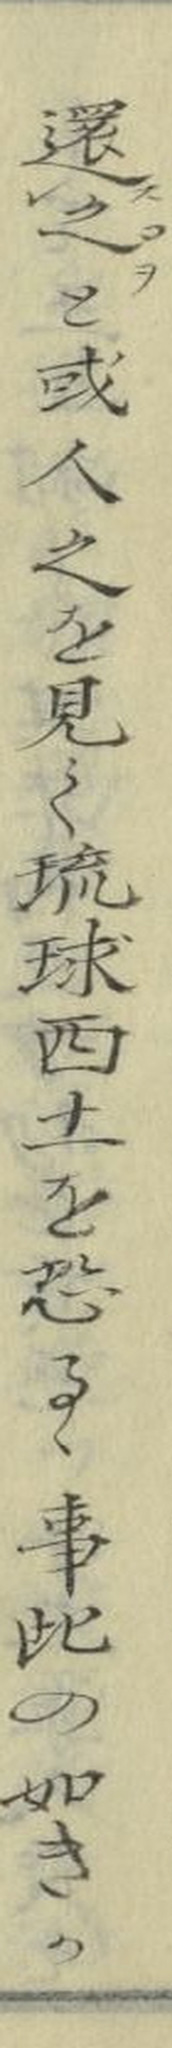還之。と或人之を見て琉球西土を恐るヽ事此の如きか
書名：琉球沿革志 下
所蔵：University of the Ryukyus Library
